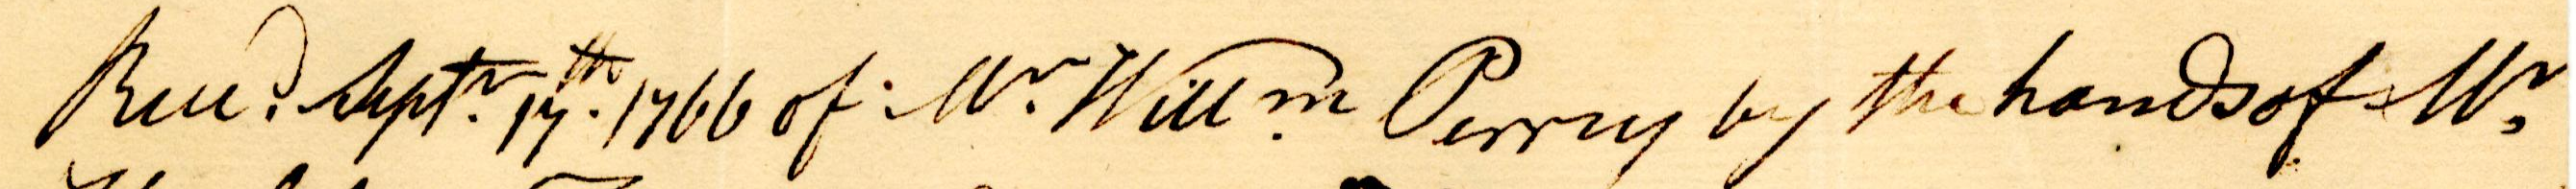Rece^d Sept^r 14^th 1766 of M^r Will^m Perry by the hands of M^r
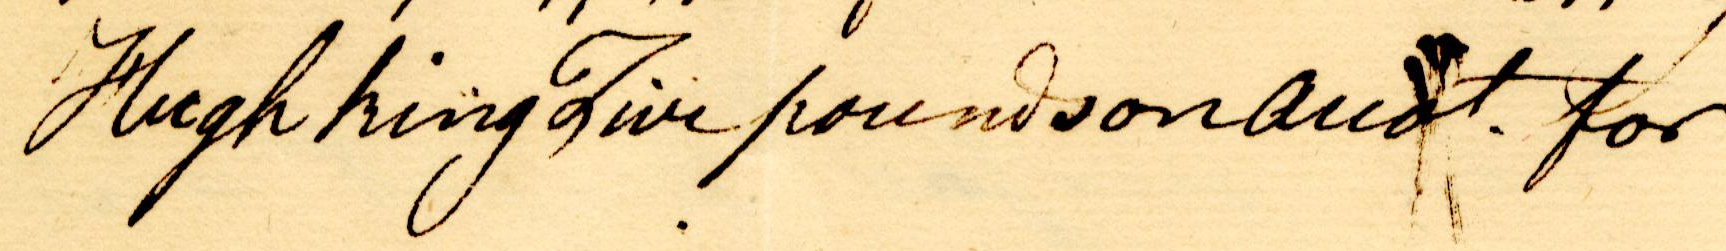Hugh King Five pounds on acco^t for
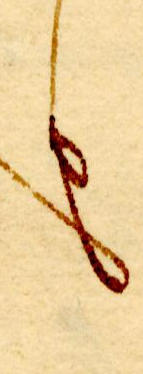To
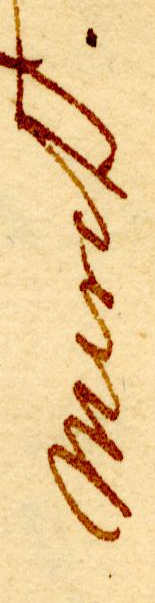Merch^t
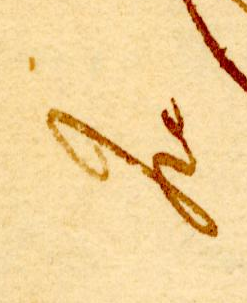he
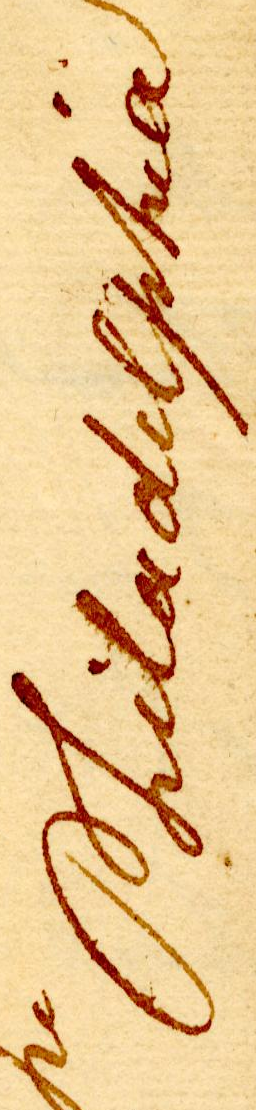Philadelphia
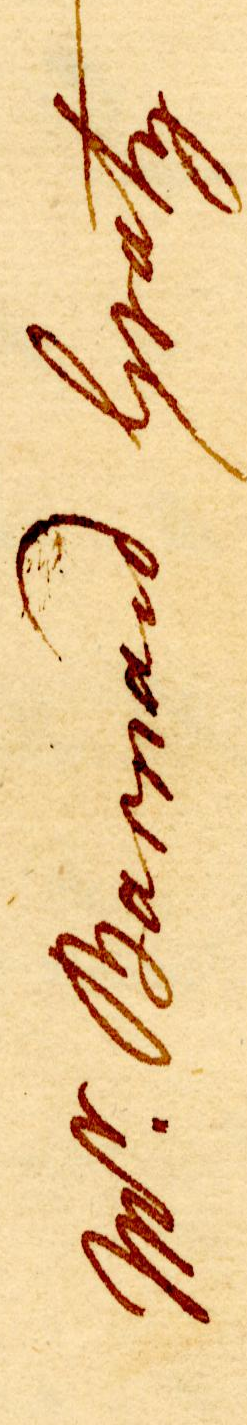M^r Barnard Gratz
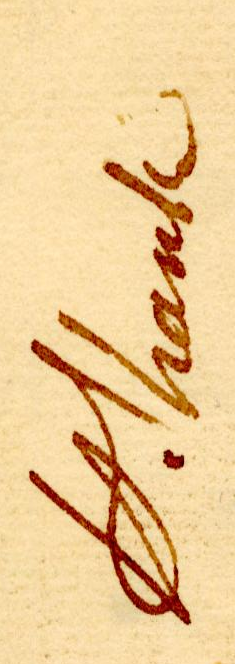G Shank
